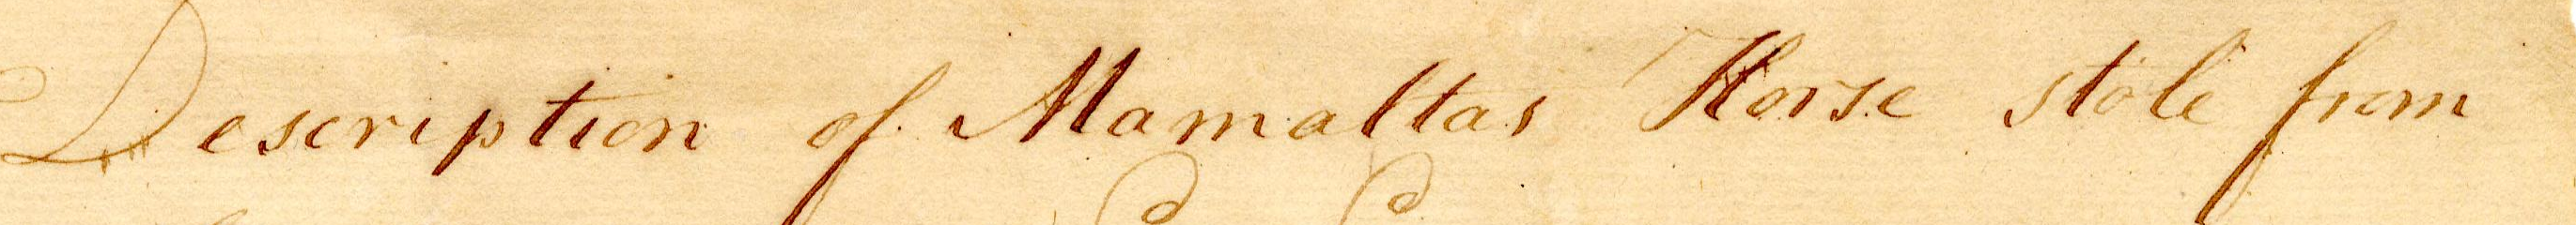Description of Mamaltas Horse stole from
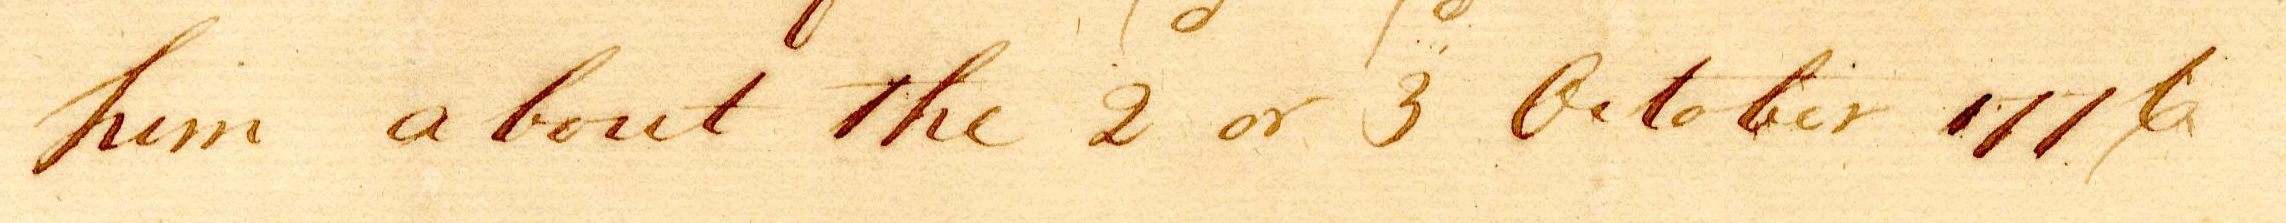him about the 2^d or 3^d October 1776
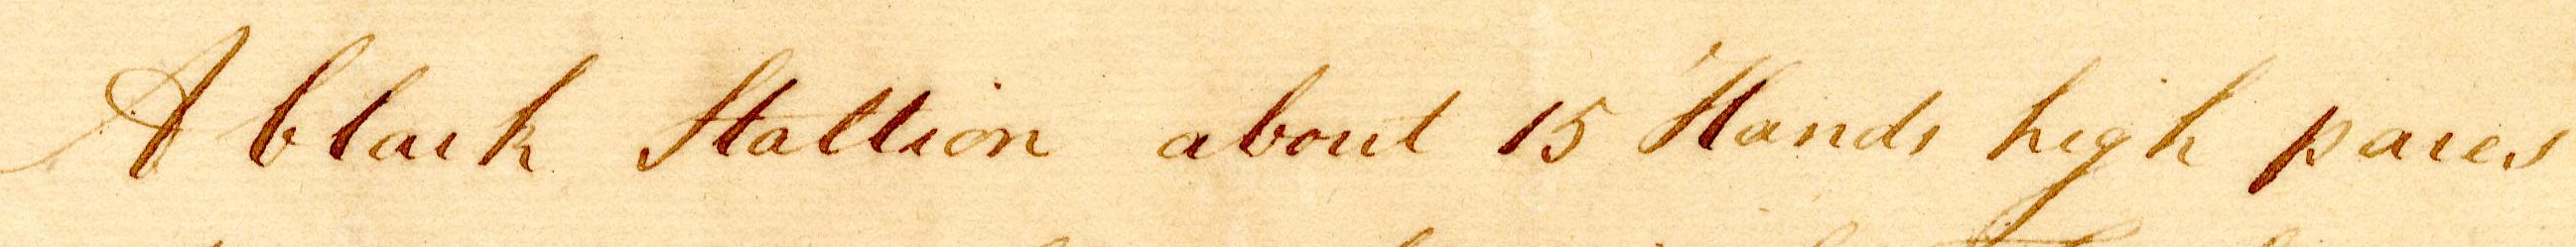A black Stallion about 15 Hands high paces
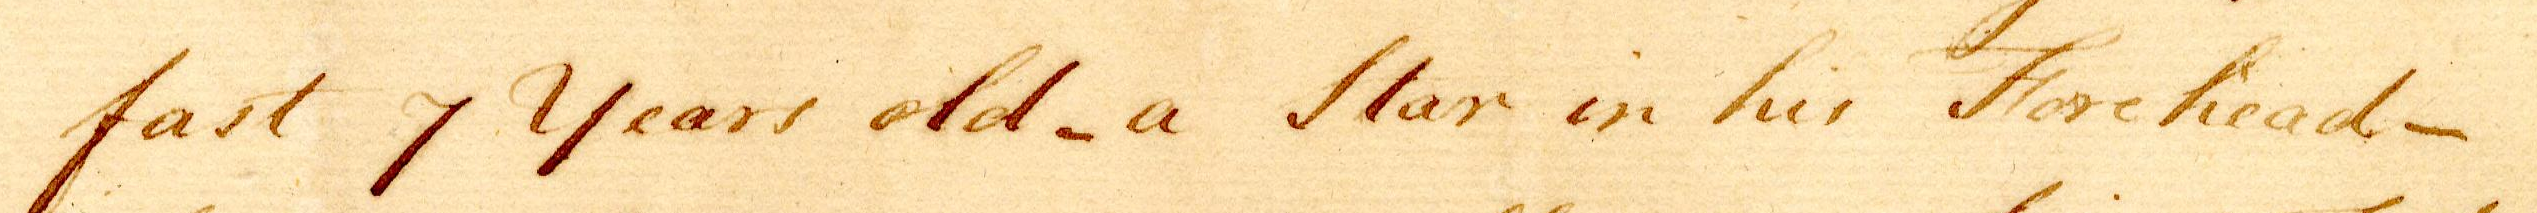fast 7 Years old, a Star in his Forehead-
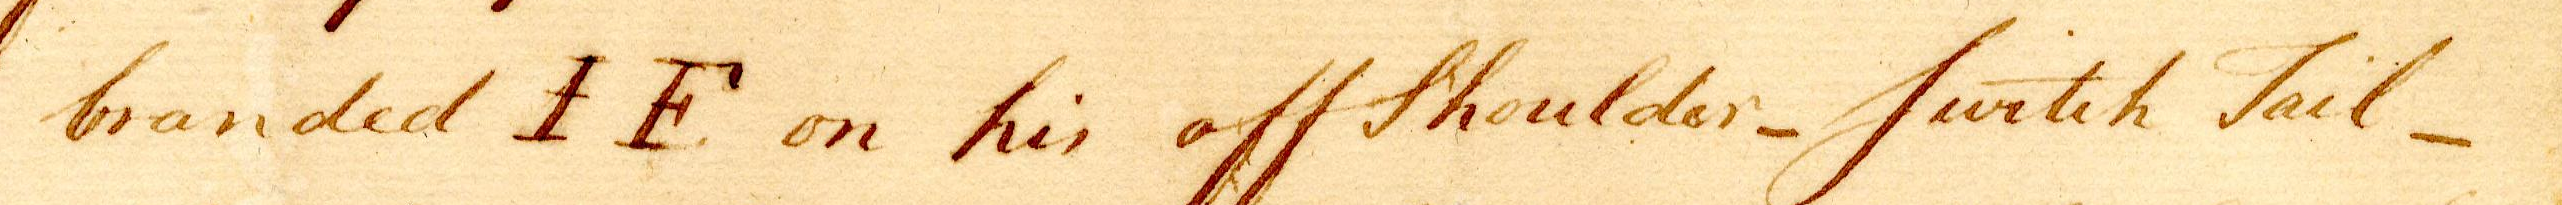branded I.F. on his off Shoulder- switch Tail-
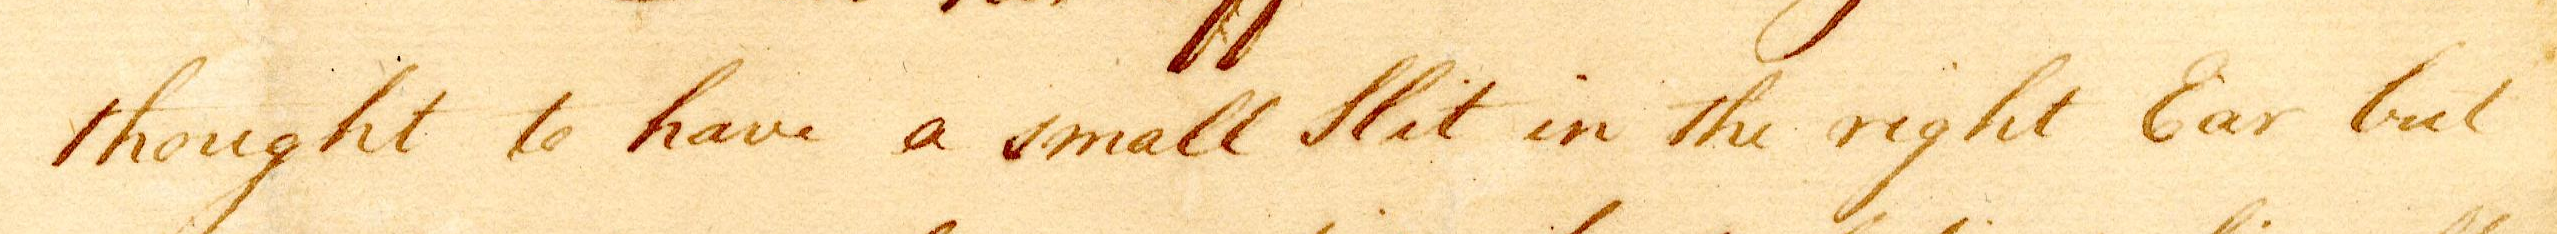thought to have a small Slit in the right Ear but
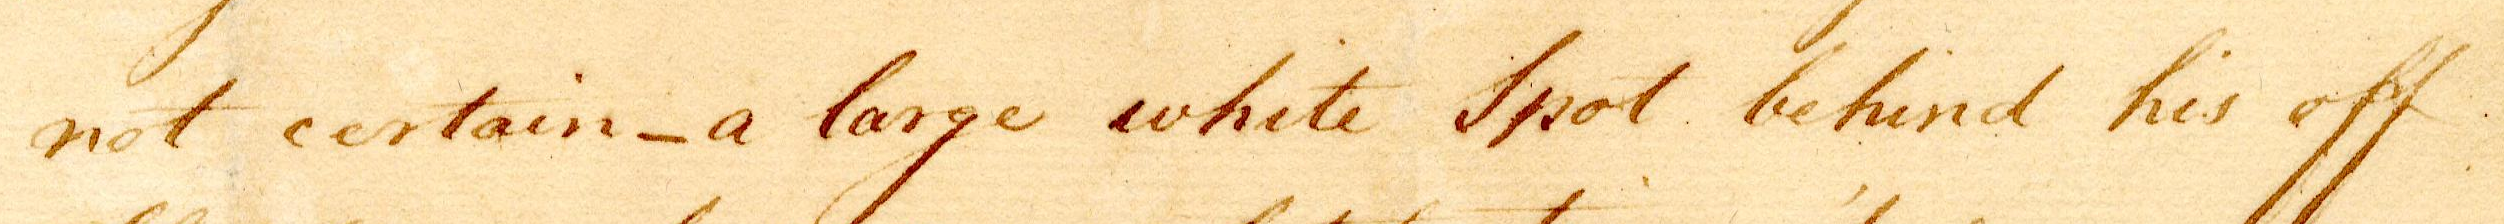not certain- a large white Spot behind his off
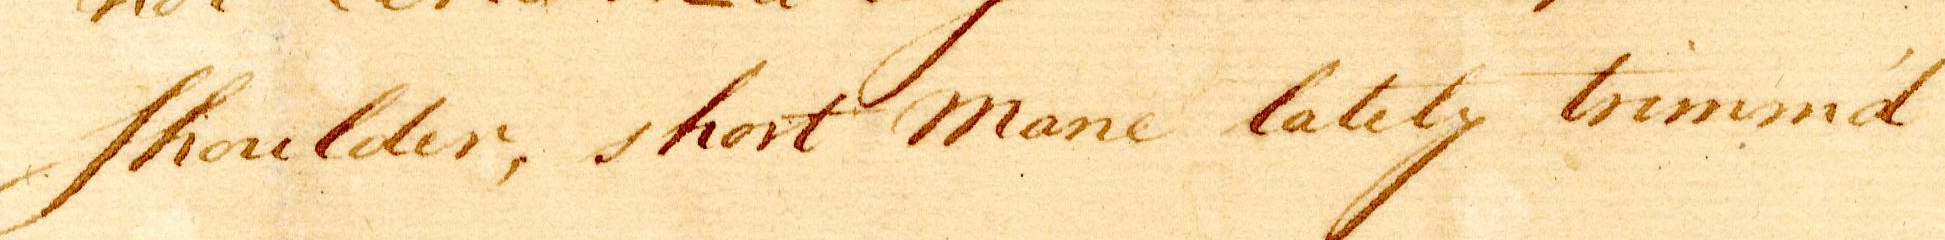Shoulder, short mane lately trimm'd
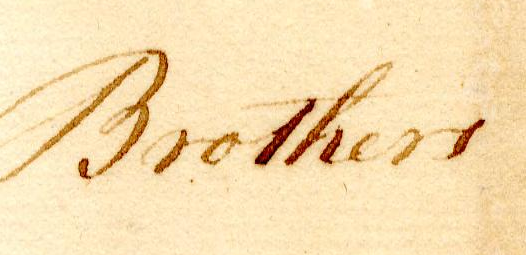Brothers
